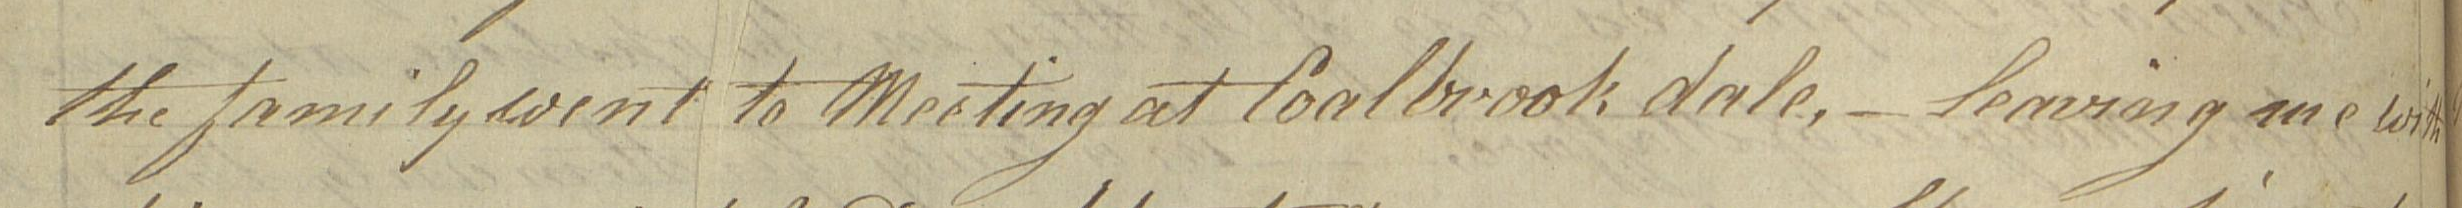the family went to Meeting at Coalbrook dale, leaving me with
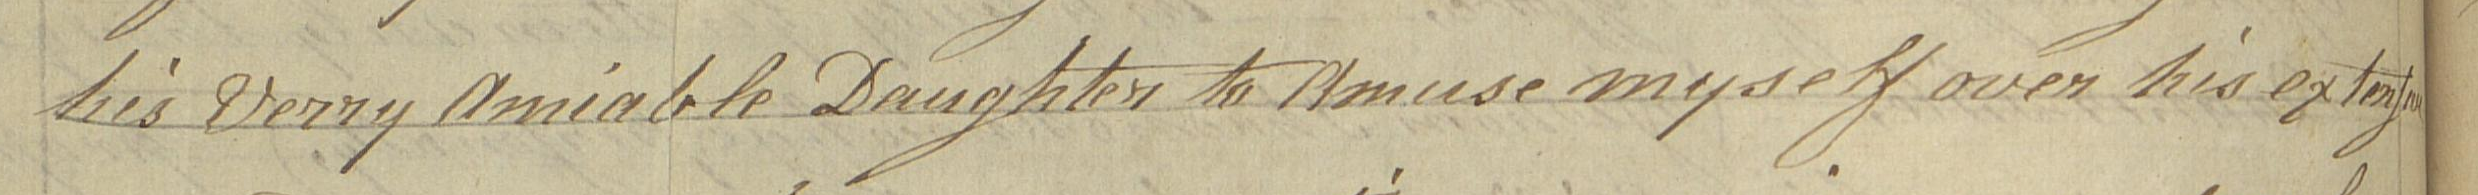his Verry Amiable Daughter to Amuse myself over his extensive
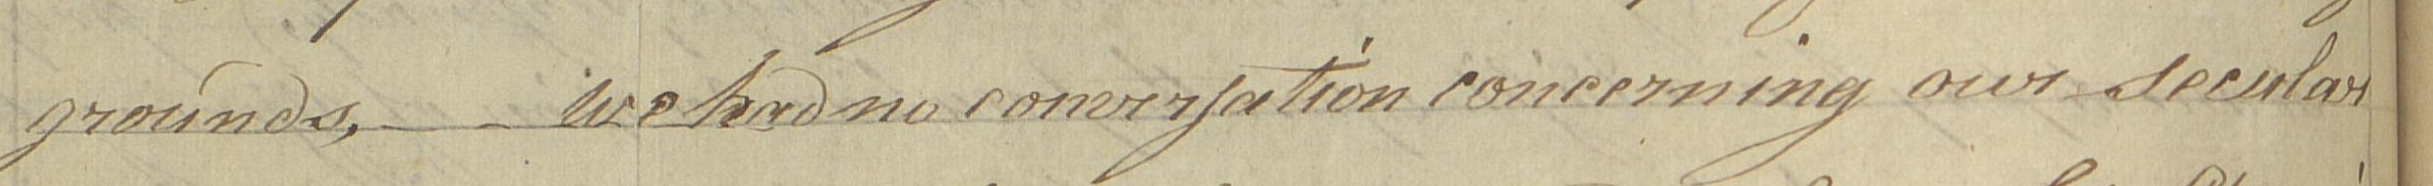grounds, We had no conversation concerning our secular
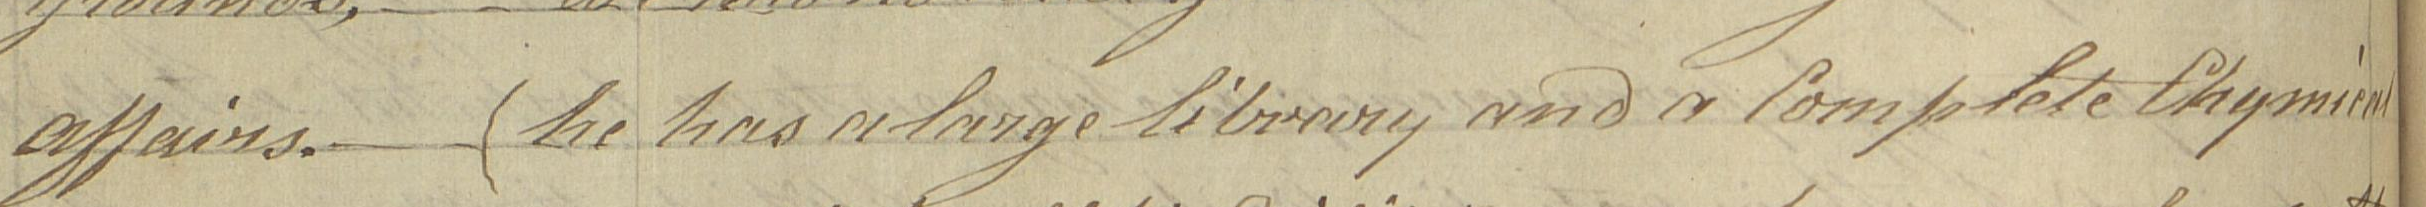affairs. (he has a large library and a Complete Chymical
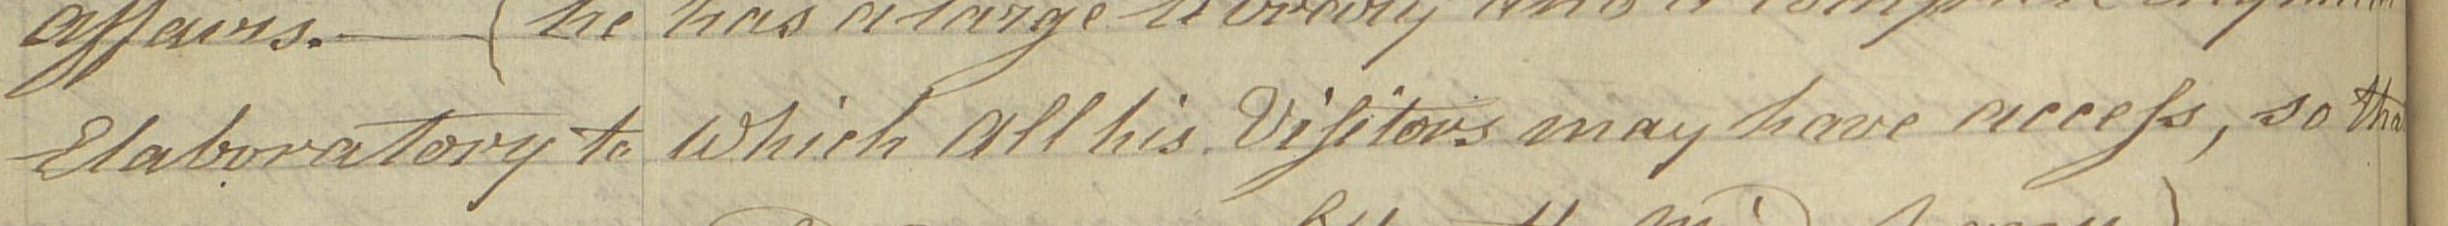Elaboratory to which all his Visitors may have access, so th-
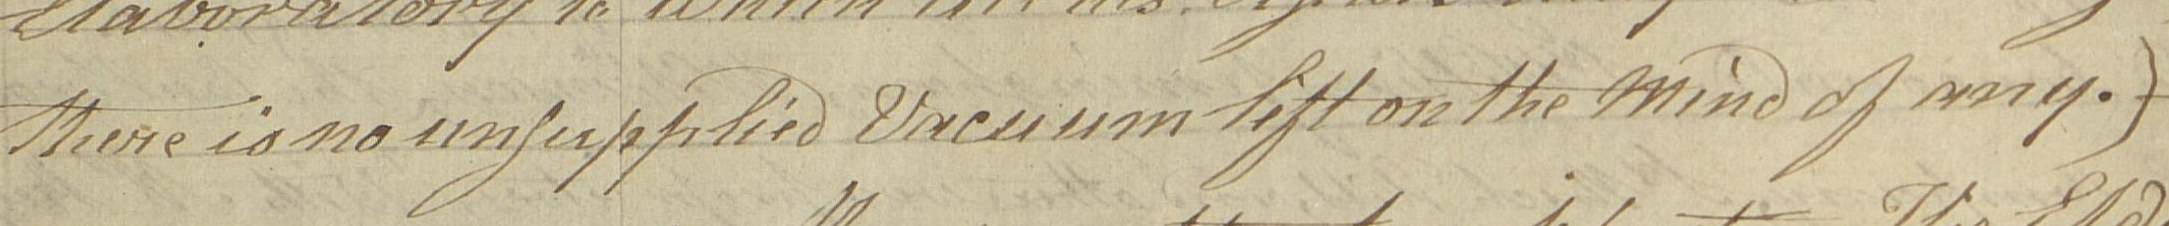there is no unsupplied Vacuum left on the Mind of any.)
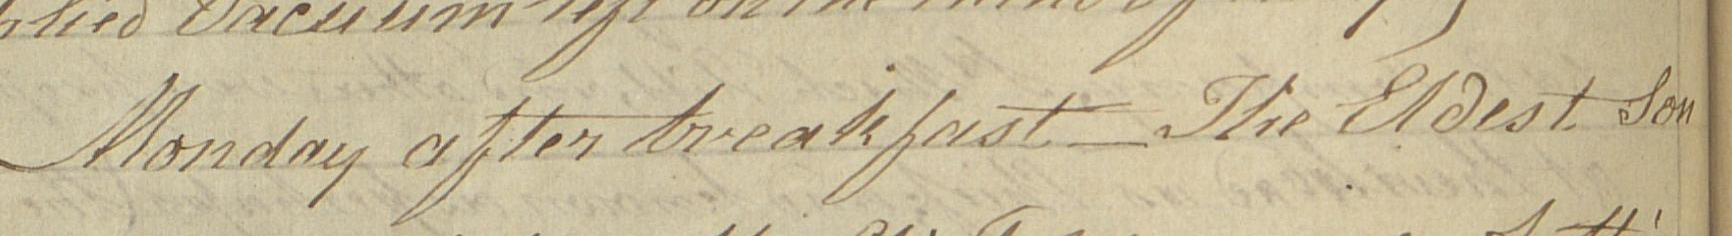Monday after breakfast The Eldest Son
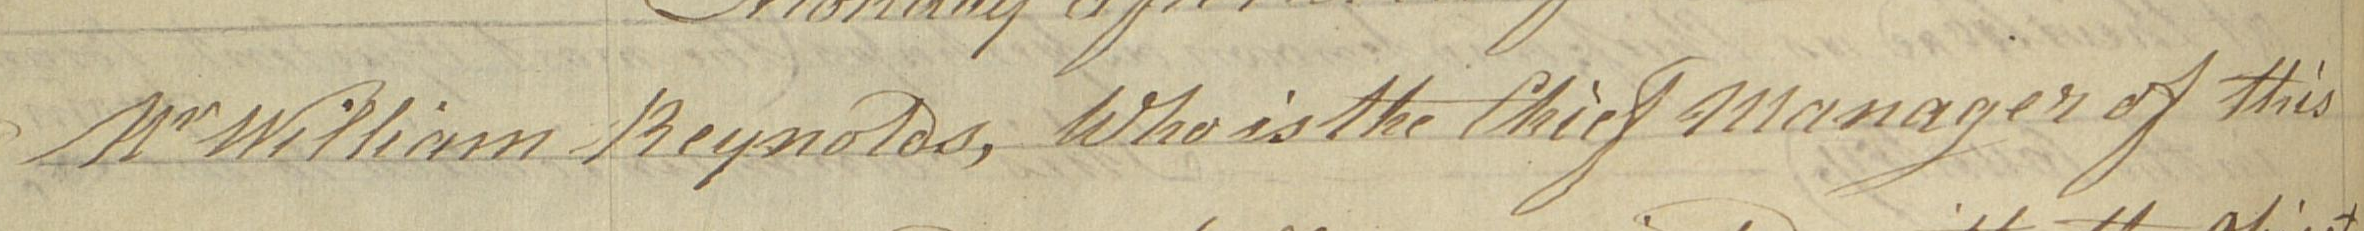M^r William Reynolds, Who is the Chief Manager of this
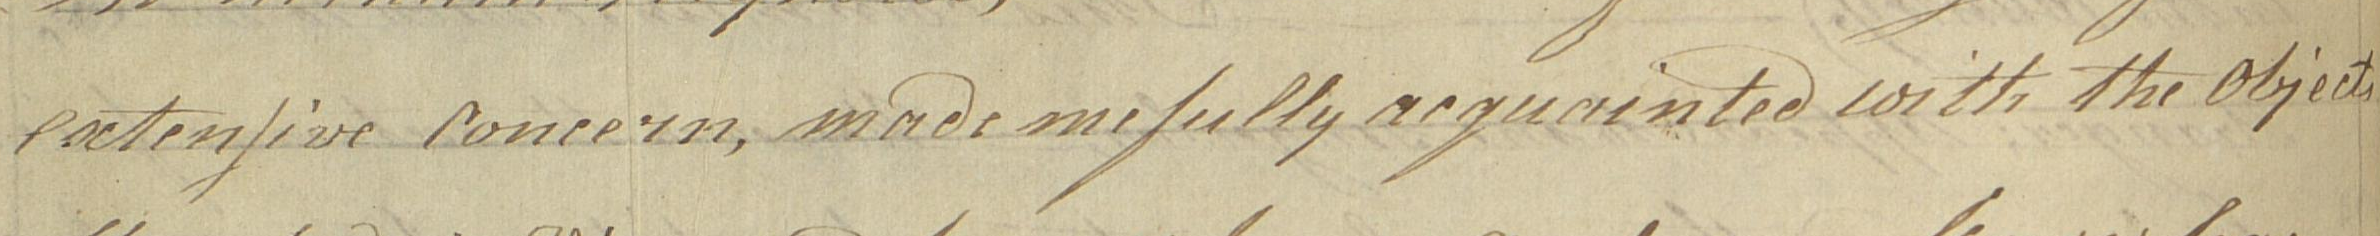extensive concern, made me fully acquainted with the Object
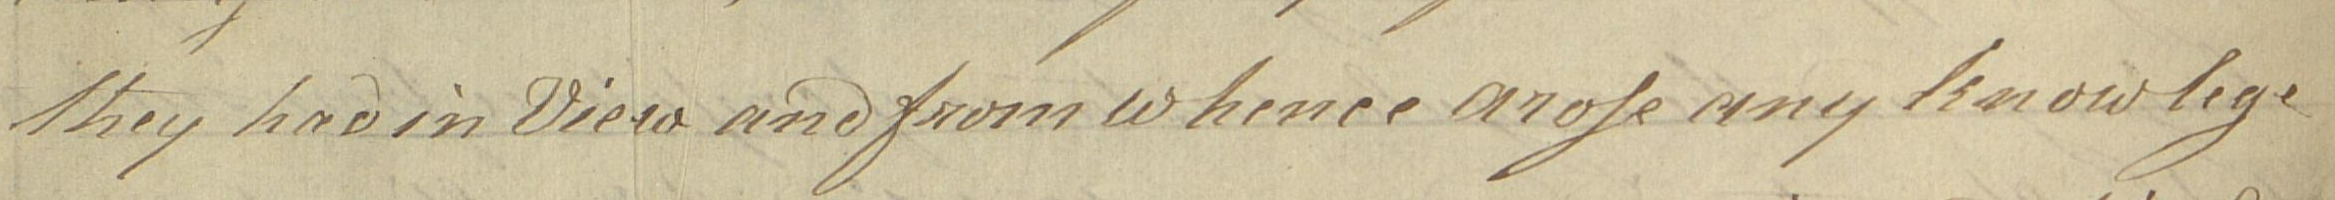they had in View and from whence arose any knowlege
